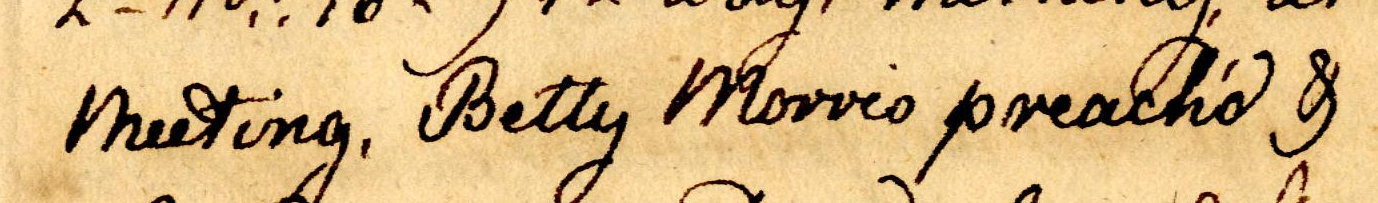Meeting, Betty Morris preach'd &
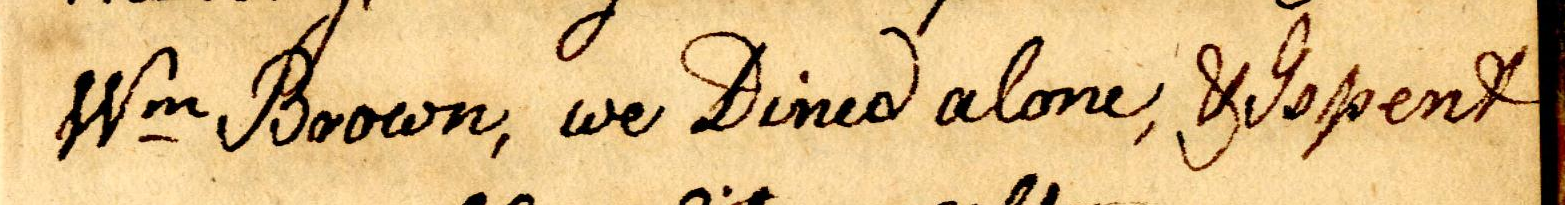W ^m Brown, we Dined alone, & I spent
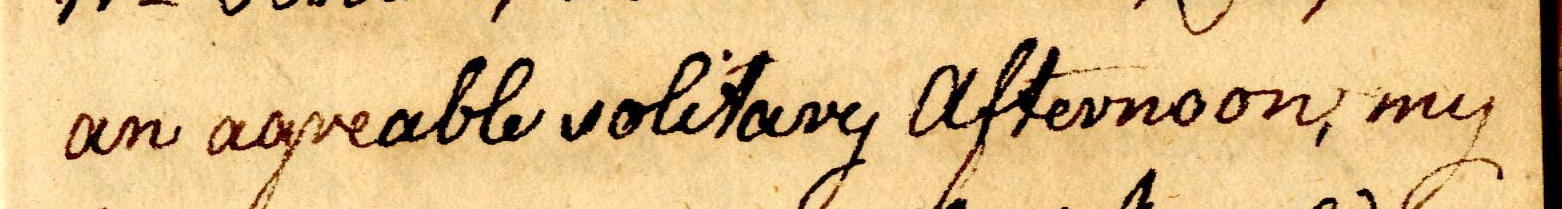an agreable solitary Afternoon, my
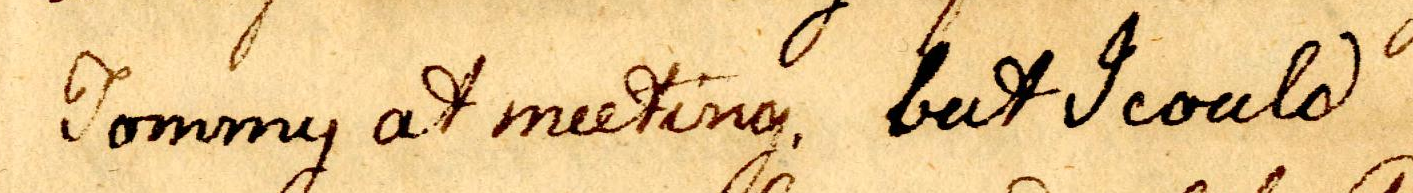Tommy at meeting, but I could
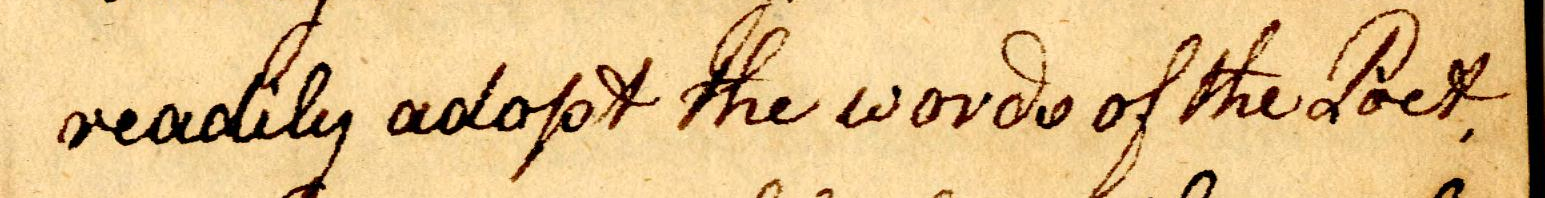readily adopt the words of the Poet,
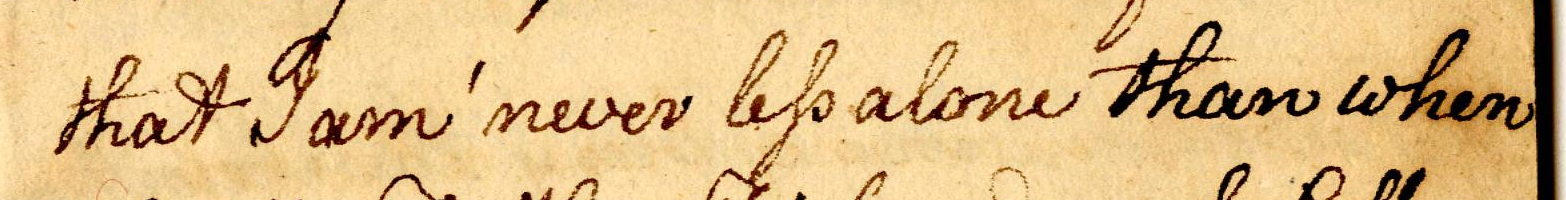that I am 'never less alone than when
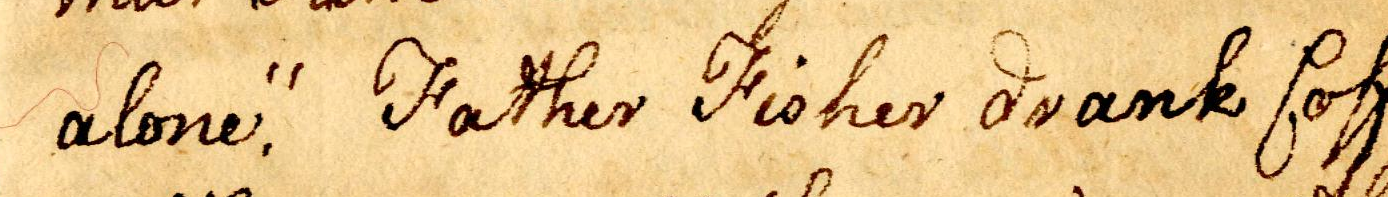alone." Father Fisher drank Coffe
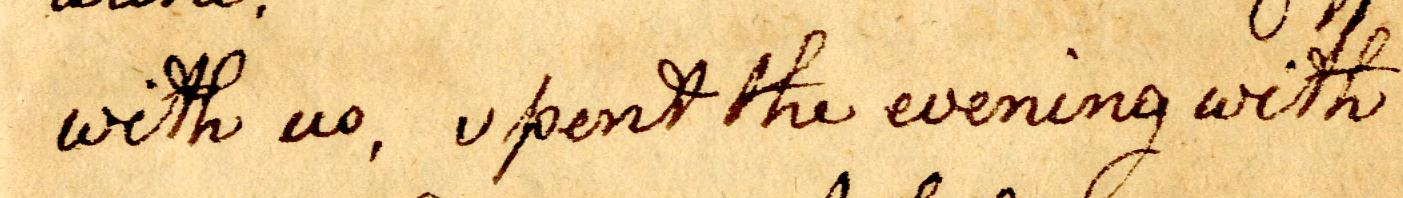with us, spent the evening with
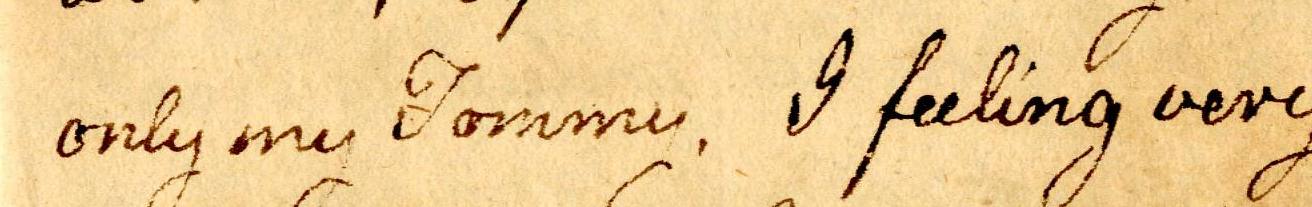only my Tommy, I feeling very
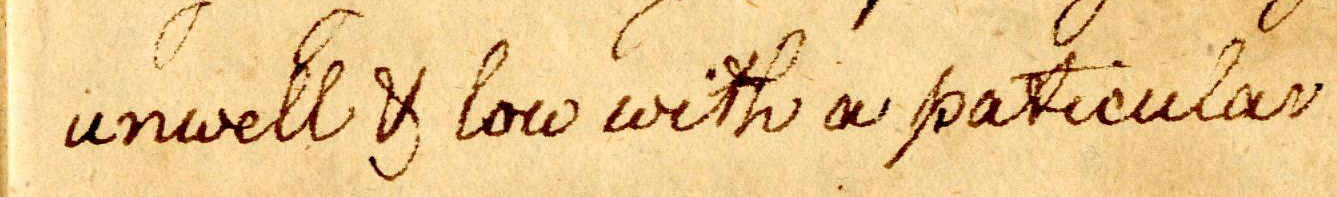unwell & low with a paticular
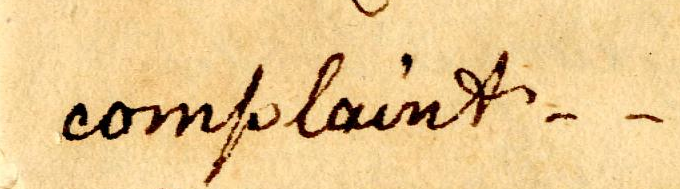complaint-
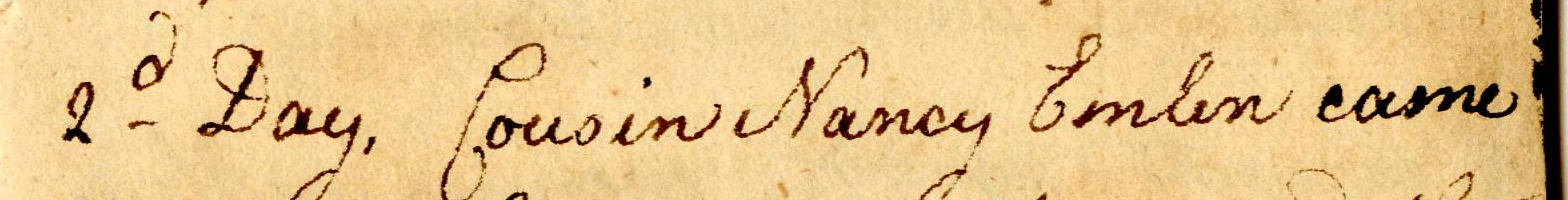2^d Day, Cousin Nancy Emlen came
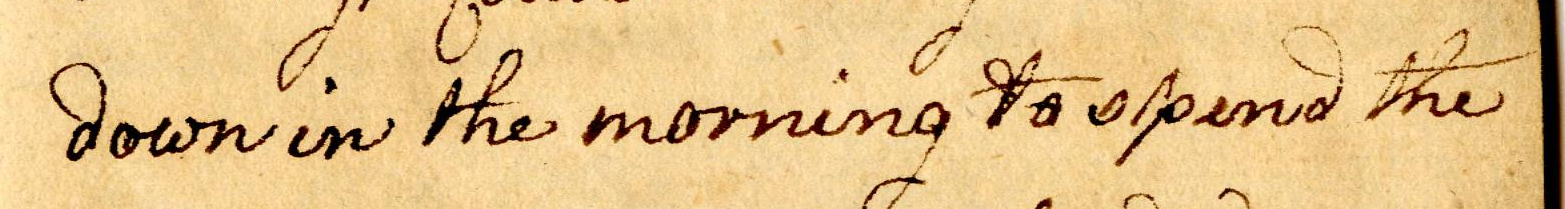down in the morning to spend the
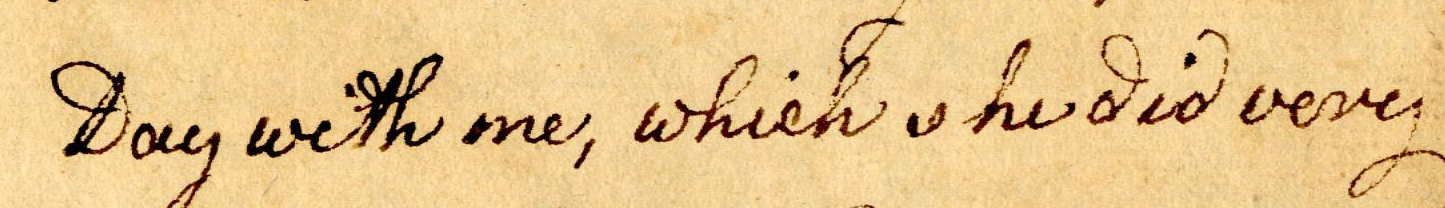Day with me, which she did very
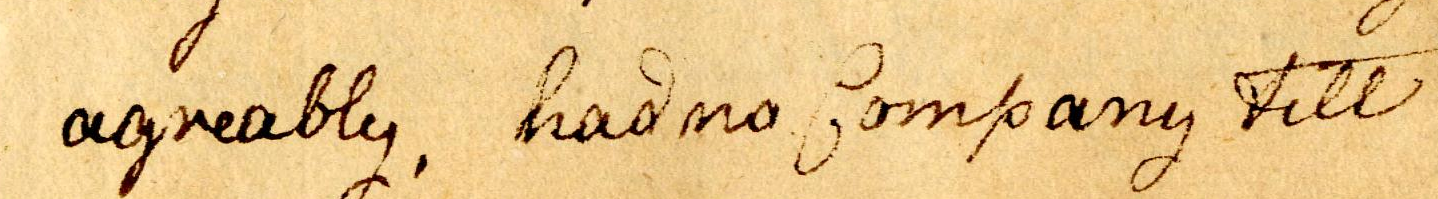agreably, had no Company till
